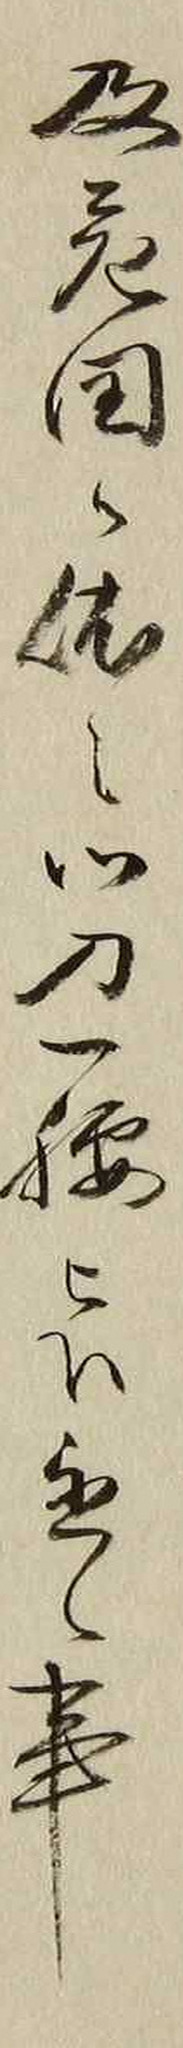及指図候依之御刀一腰被下置候事
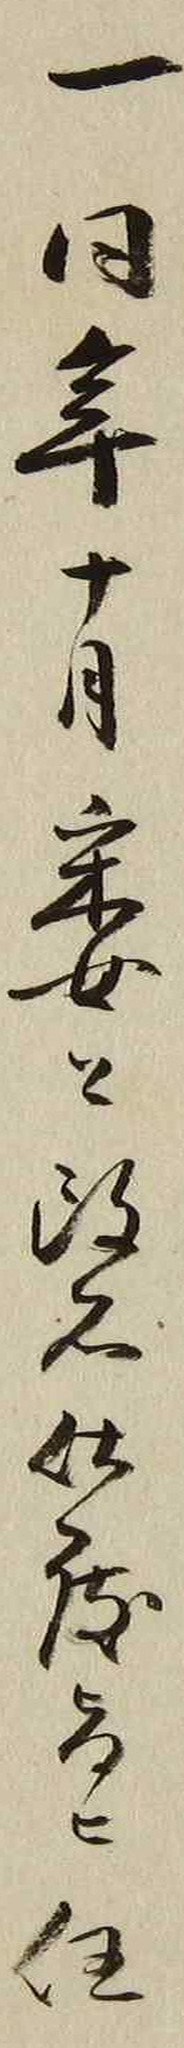一同年十月采女と改名仕度旨被任
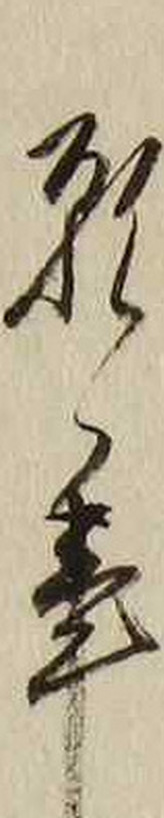願候事
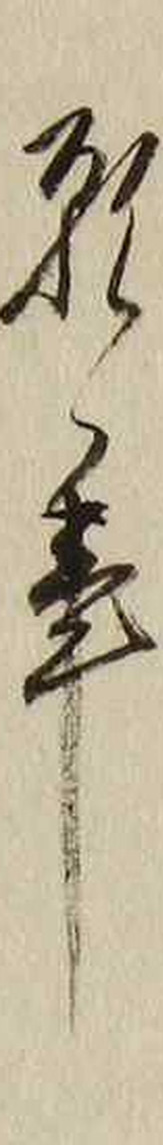願候事
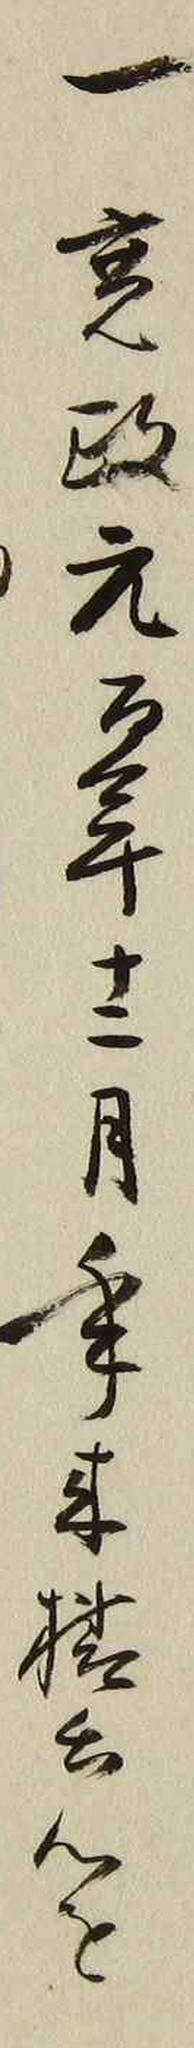一寛政元酉年十二月年來精出心を
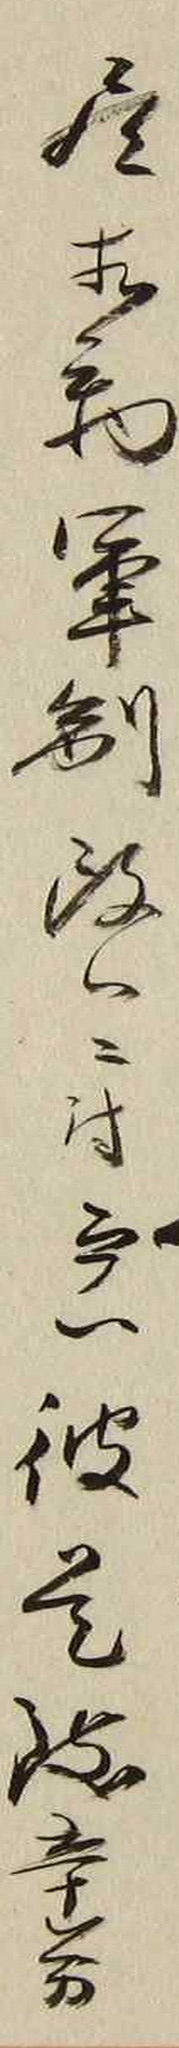尽相勤軍制改候に付而は彼是致辛労
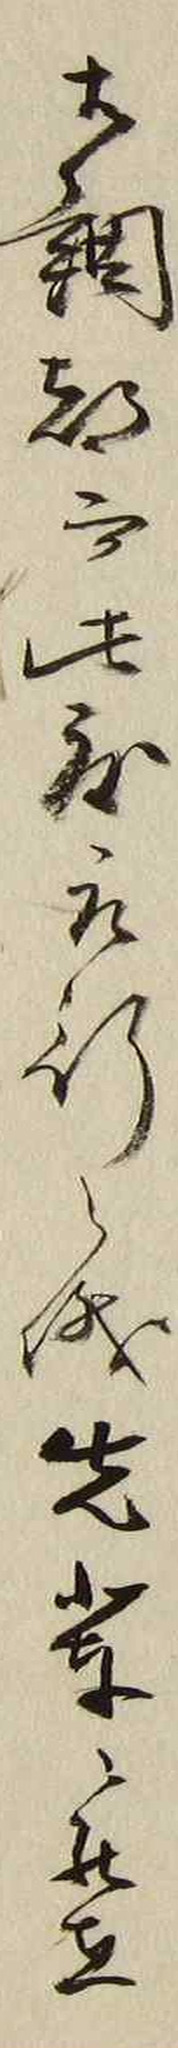相調都而其度取行候儀先輩に罷在
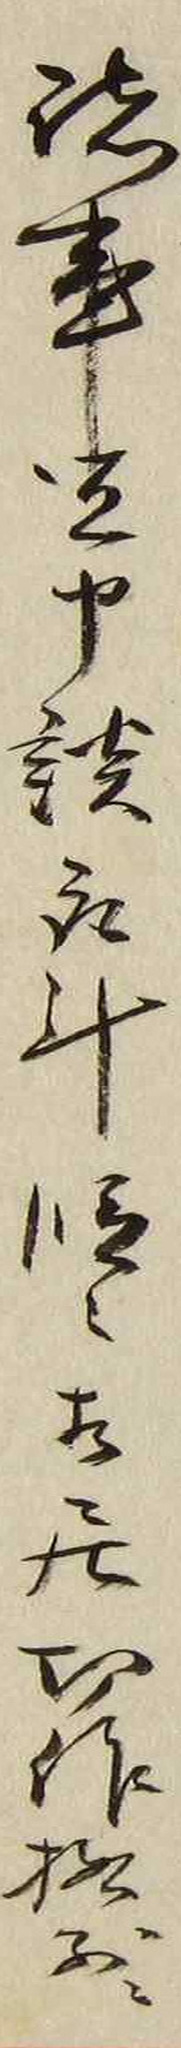諸事宜申談取斗段々相居切作格別に
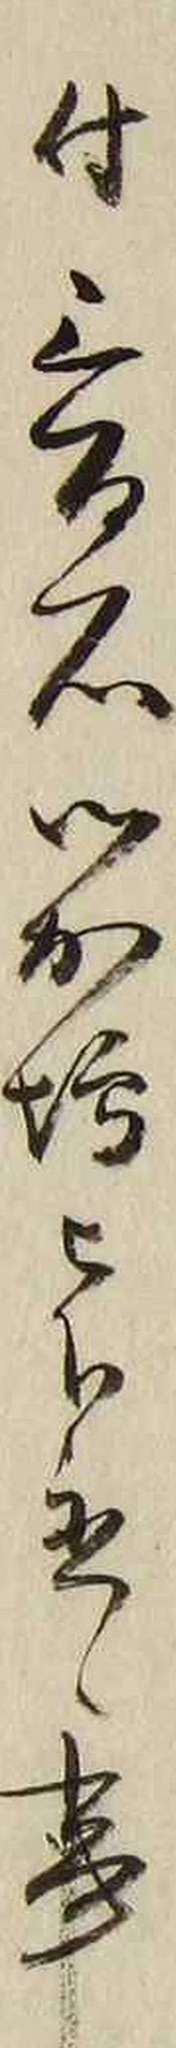付三百石御加増被下置候事

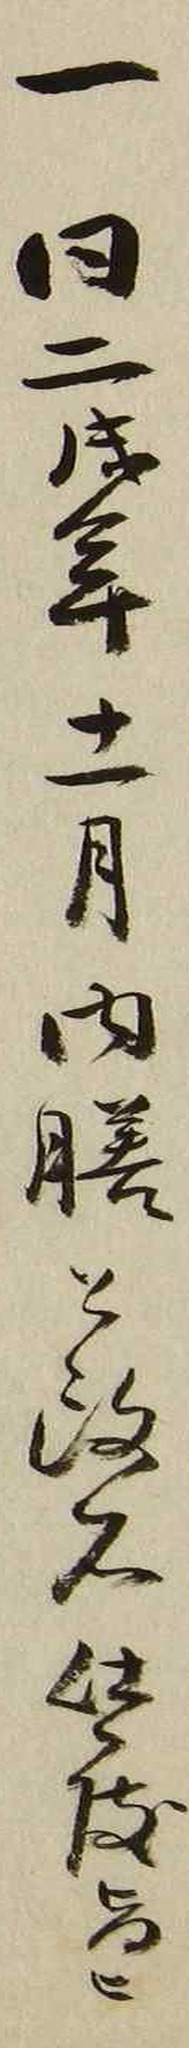一同二戌年十一月内膳と改名仕度旨被
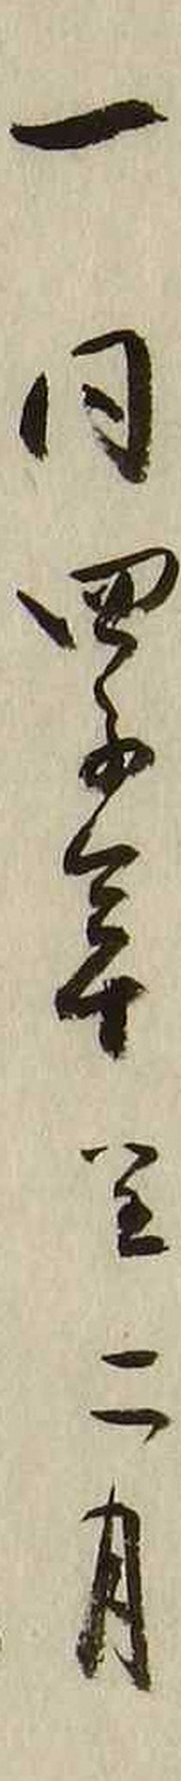一同四子年閏二月
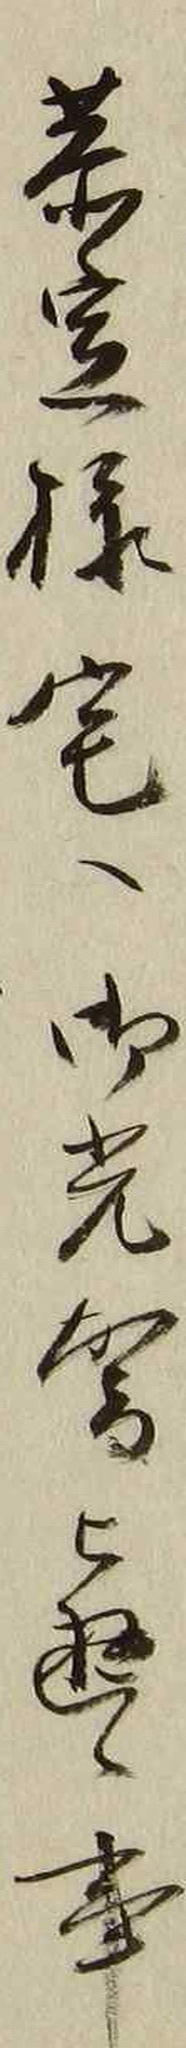恭定様宅へ御光駕被遊候事
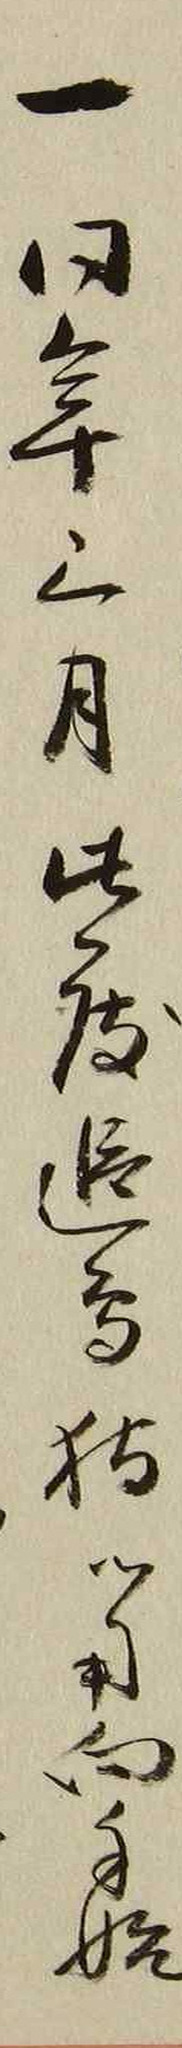一同年三月此度追鳥狩御用向手始
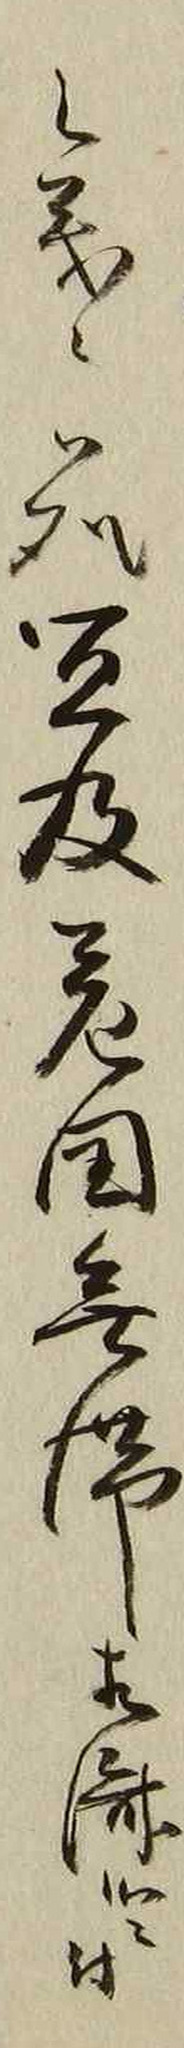之義に候処宜及指図無滞相済候に付
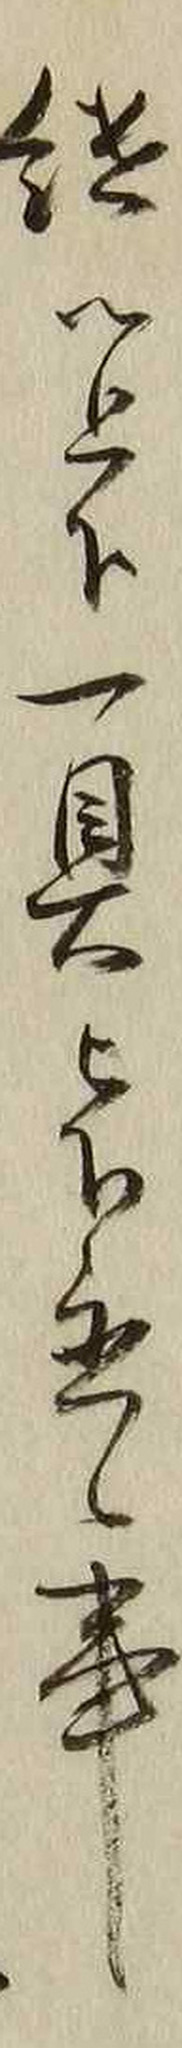継御上下一具被下置候事
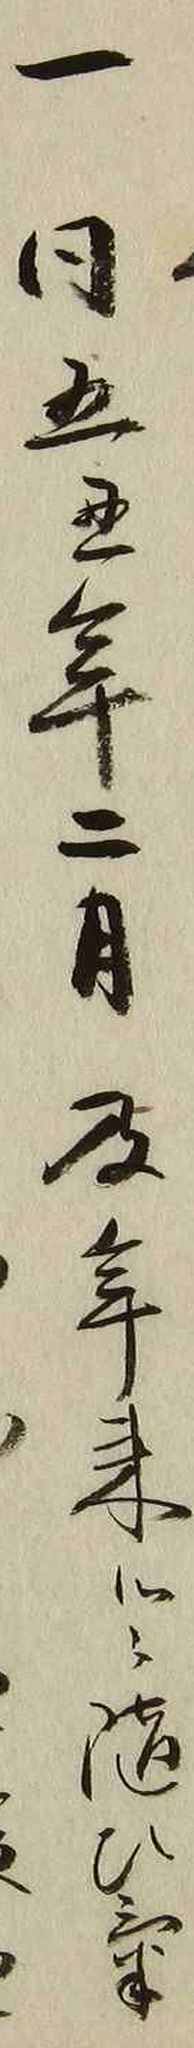一同五丑年二月及年來候に随ひ気
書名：諸士系譜　巻之292　き之部1
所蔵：会津若松市立会津図書館
